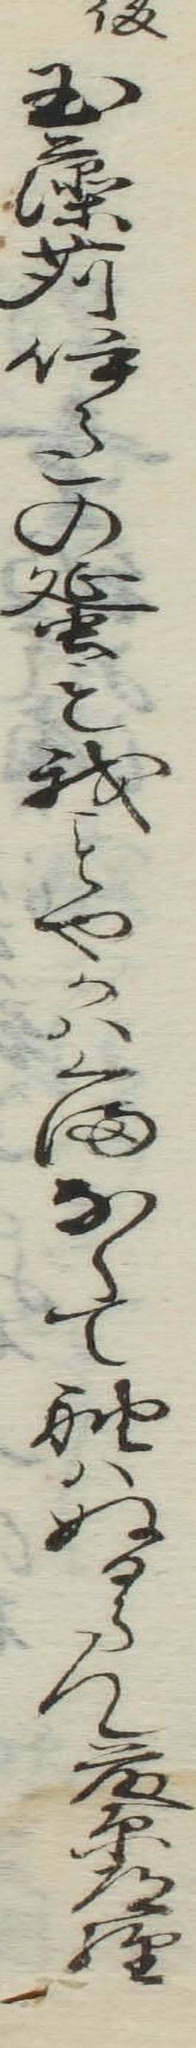続後撰玉藻苅いらこの蛋も我ことやかはくまなくて袖はぬるらん藤原道経
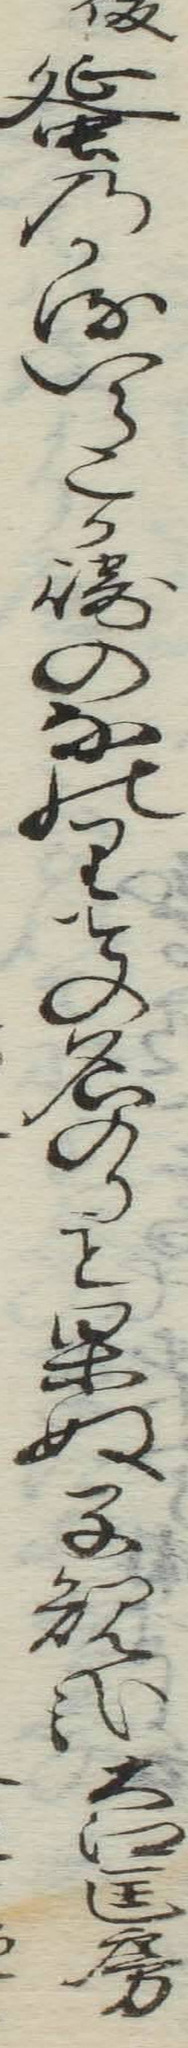続後拾蛋のかるいらこか崎のなのりその名のりも果ぬ子規哉大江匡房
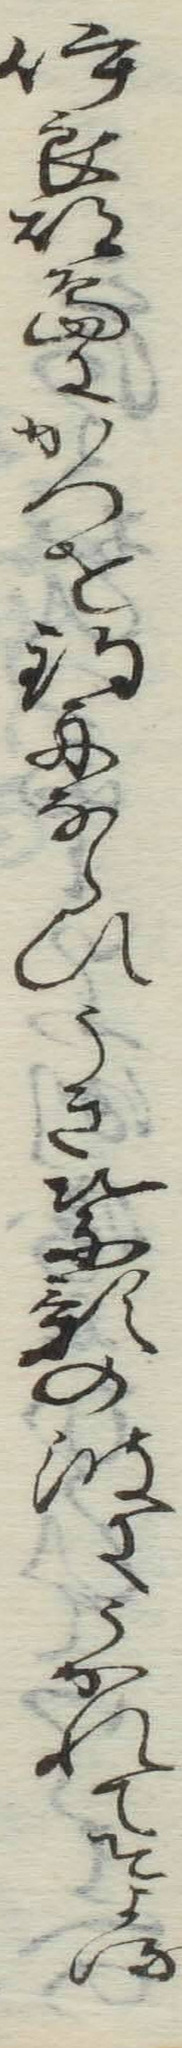いらこ島にかつを釣舟ならひうき葉影の波にうかれてそよる
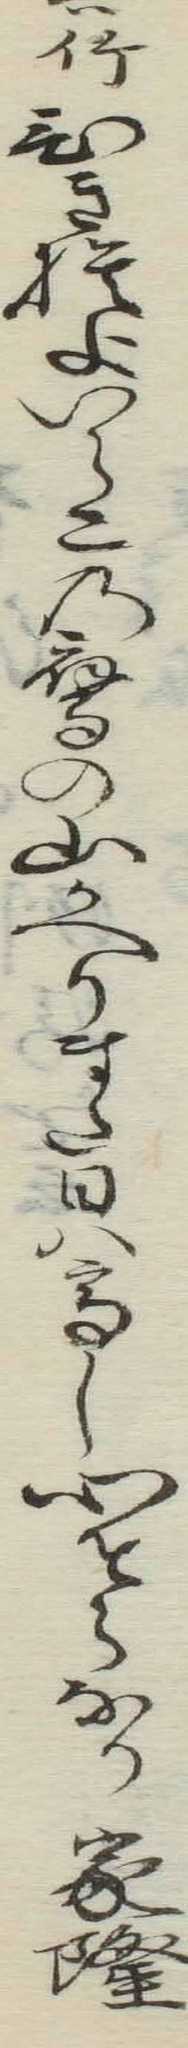呉竹ひき捨よいらこの鷹の山かへりまた日は高し心そらなり家隆
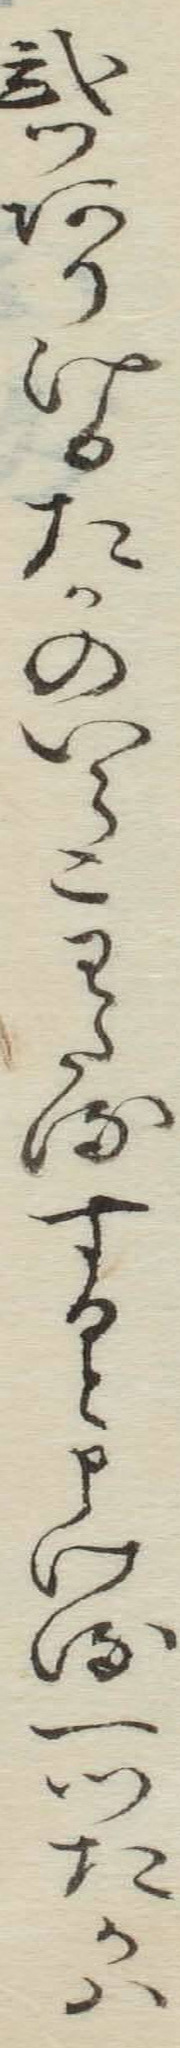弐つありけるたかのいらこわたるすると申ける一つたかは
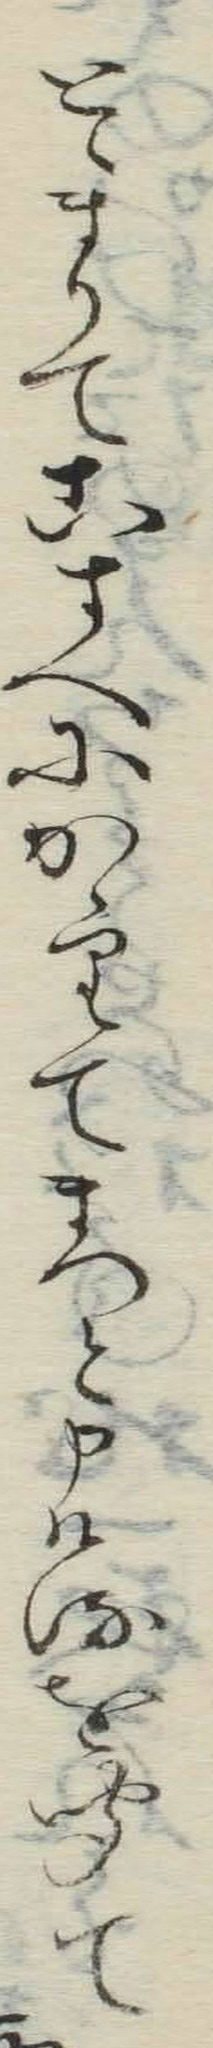とゝまりてこすへにかゝりてまつと申けるを聞て
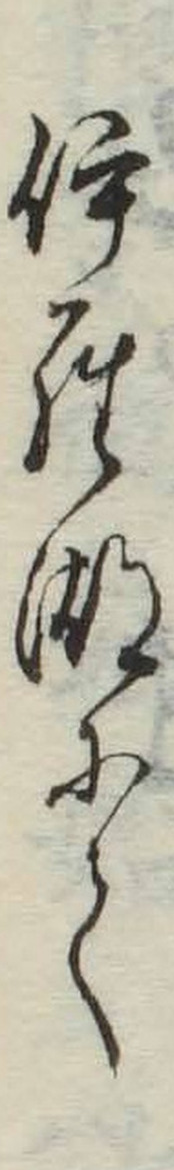いら湖にて
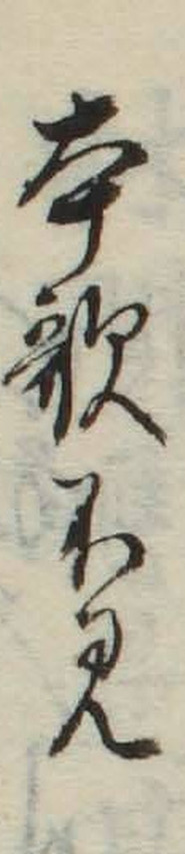本歌不見

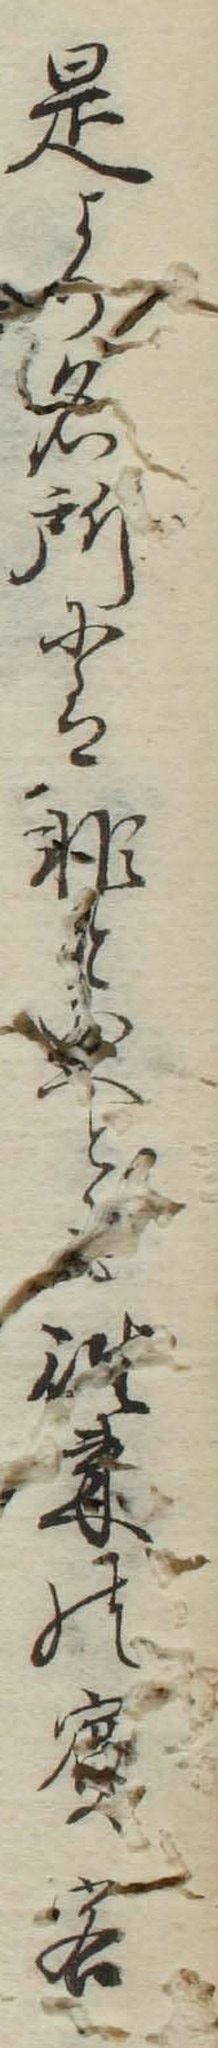是より名所には非といへとも往来の賓客
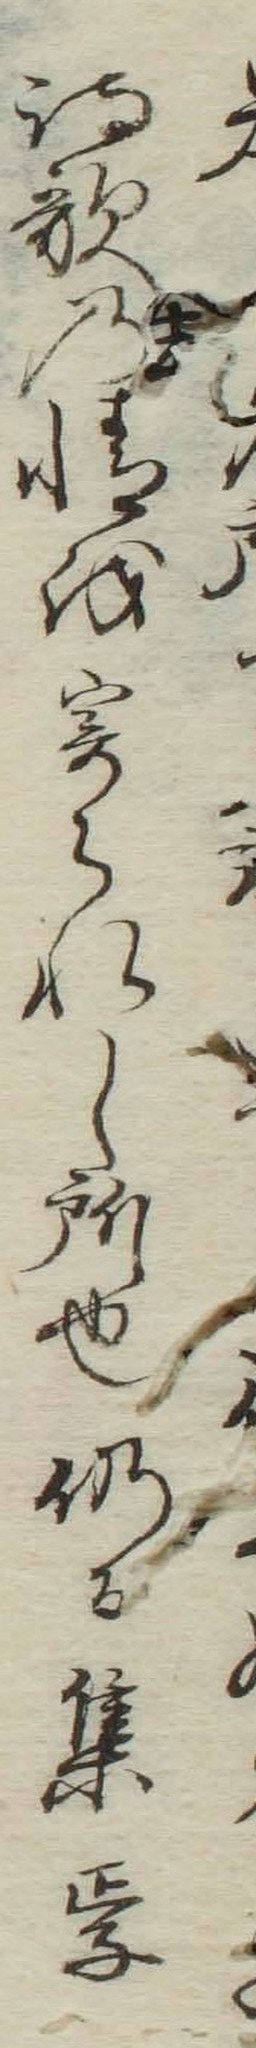歌の情を寄られし所也仍而集焉
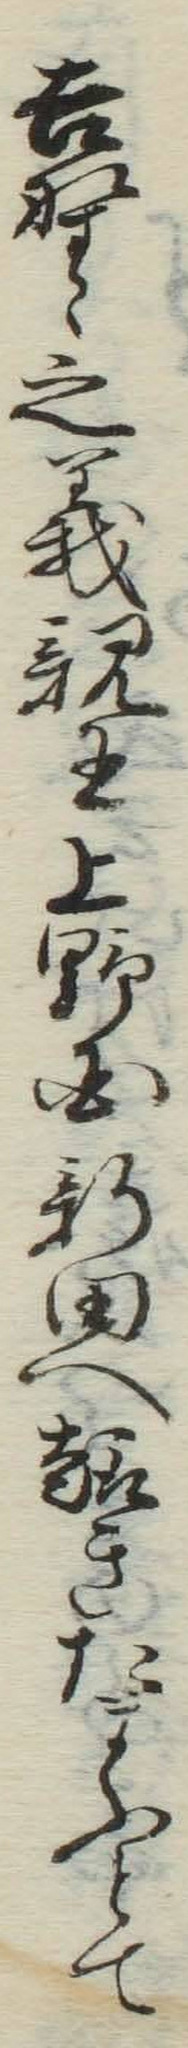吉のゝ之義親王上野国新田へ趣きたまふとて
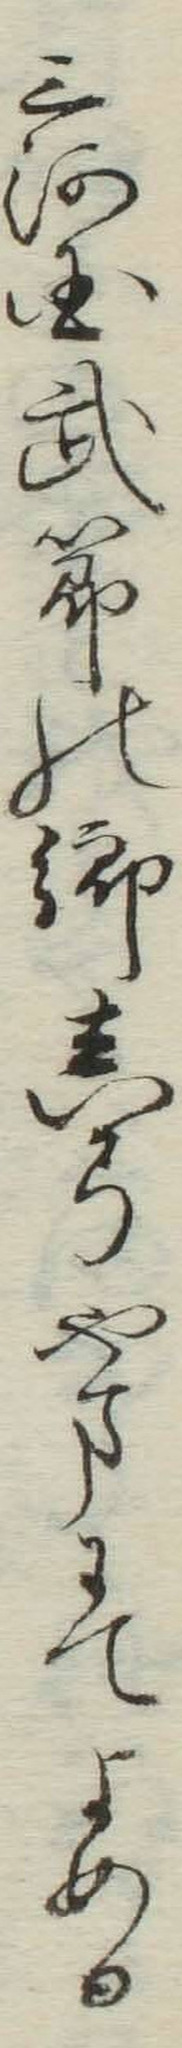三河国武節の郷真弓やまにてよめる
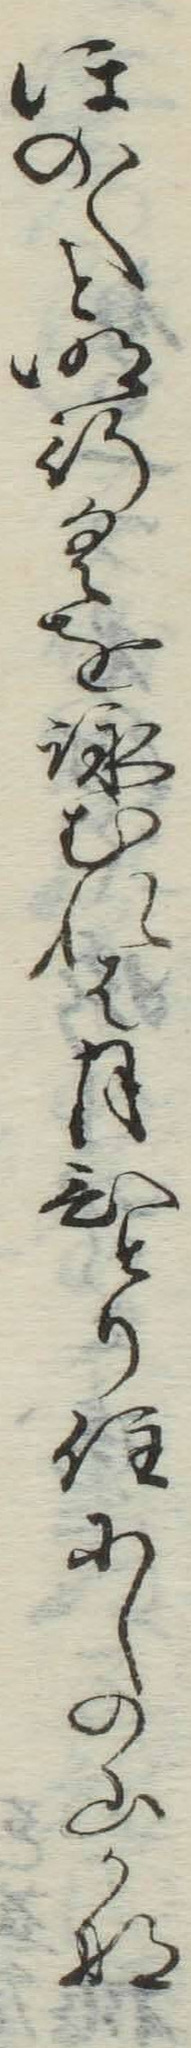ほの〳〵と明行くを詠むれは月ひとり住にしのやまかな
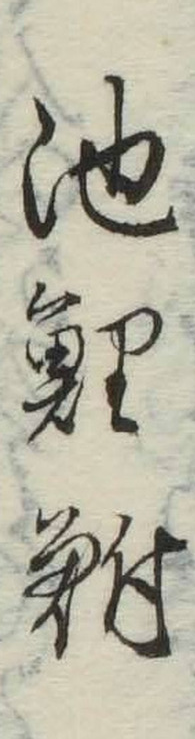池鯉鮒
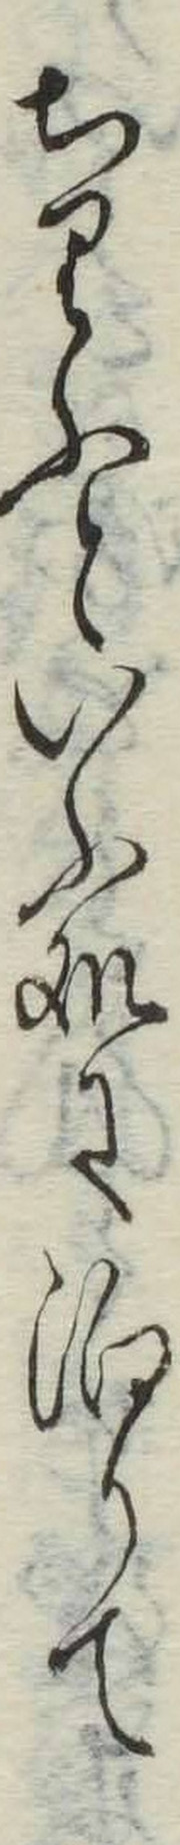ちりふといふ処に泊りて
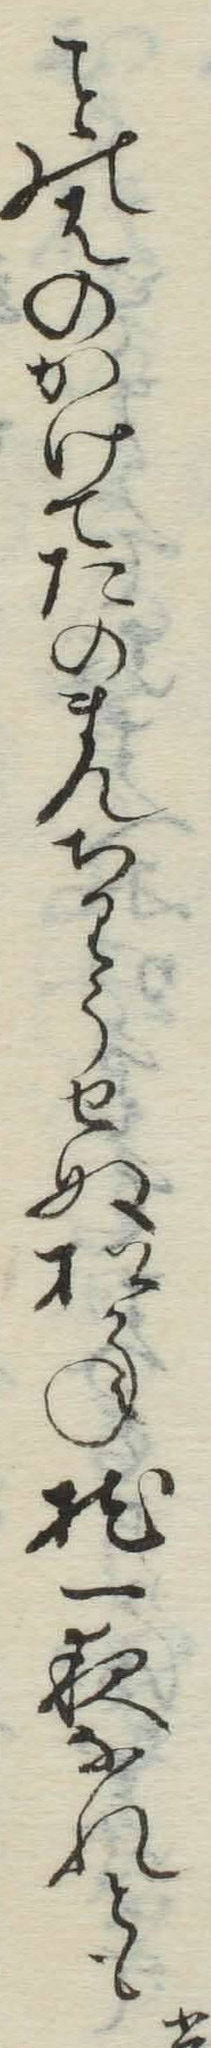ことのはのかけてたのまんちりうせぬ松かね枕一夜なれとも光廣卿
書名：三河国二葉松
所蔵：国文学研究資料館
